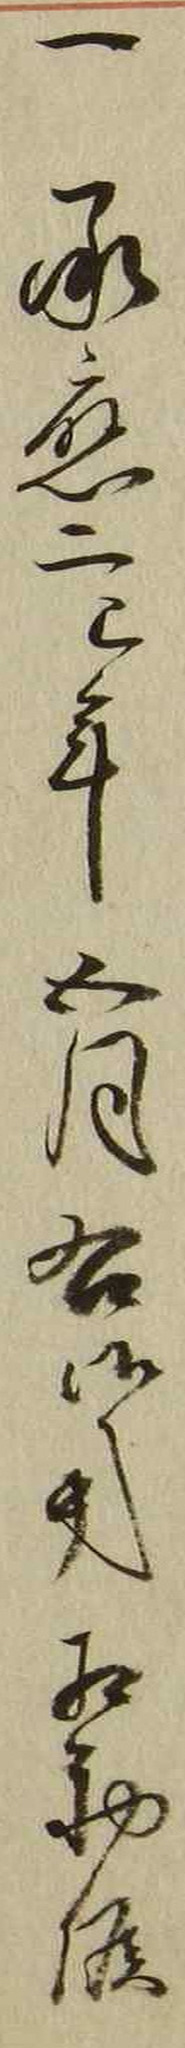一承応二巳年五月右御用相勤候
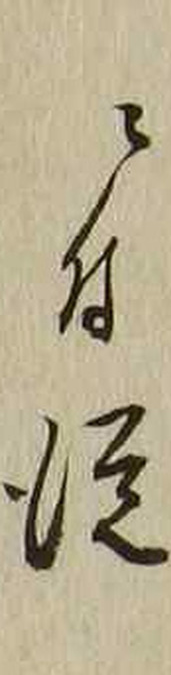ニ付従
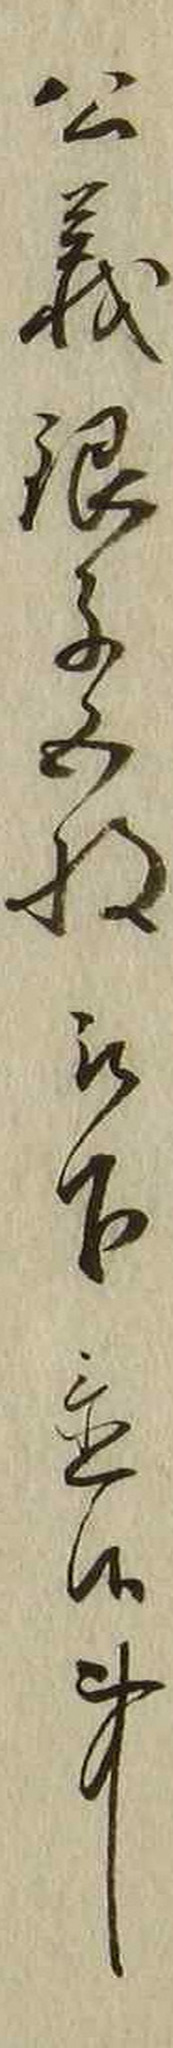公儀銀子五枚被下置候事
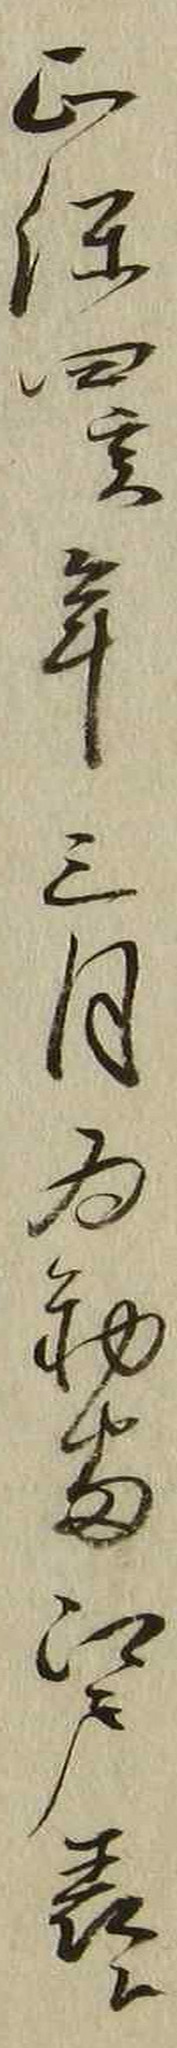正保四亥年三月為勤番江戸表江
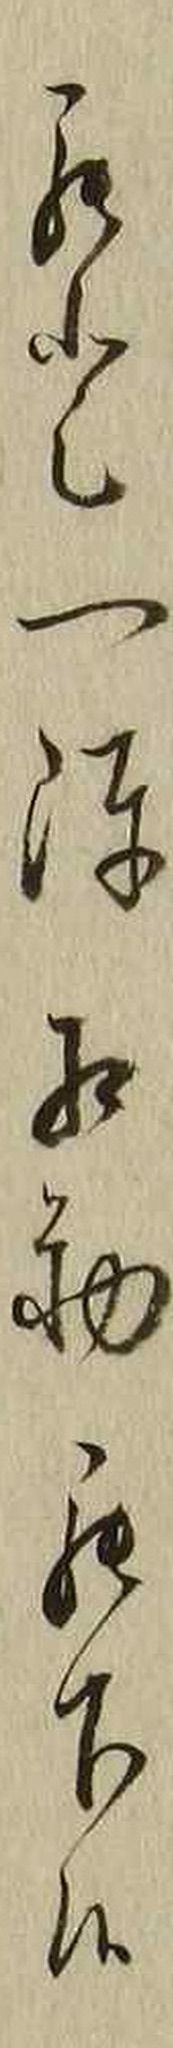罷登一陣相勤罷下候
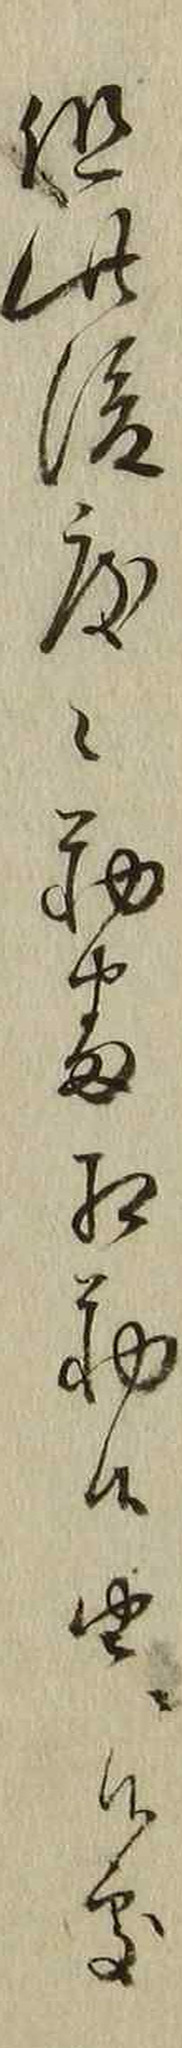但此後度々勤番相勤候由ニ候処
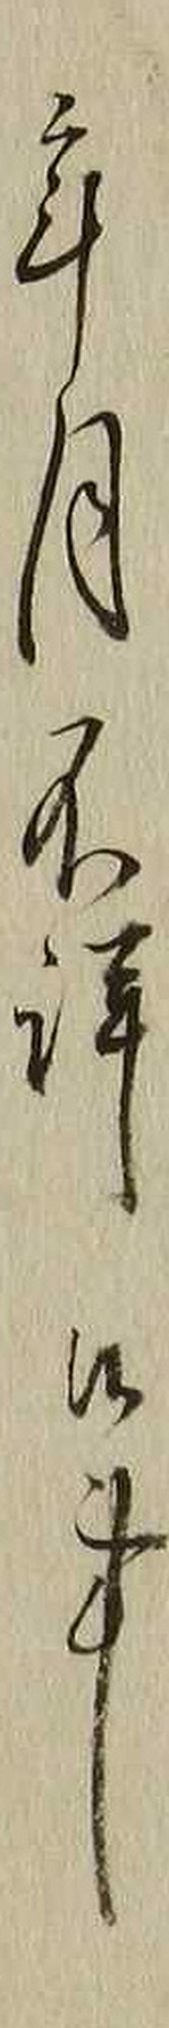年月不詳候事
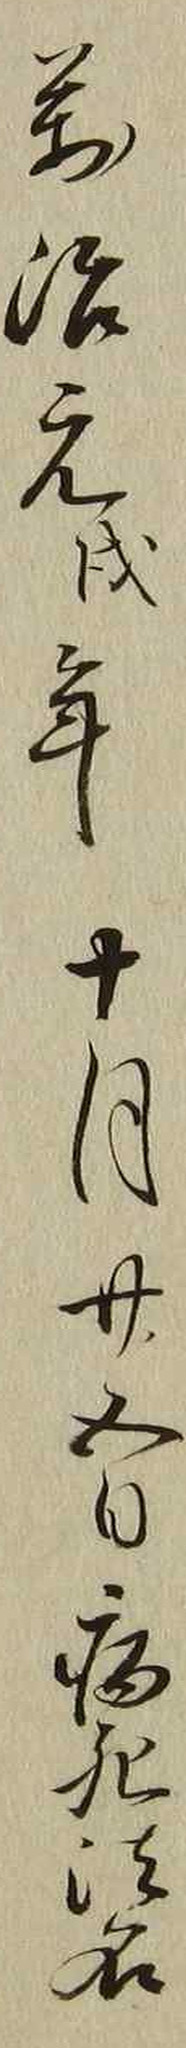万治元戌年十月二十五日病死法名
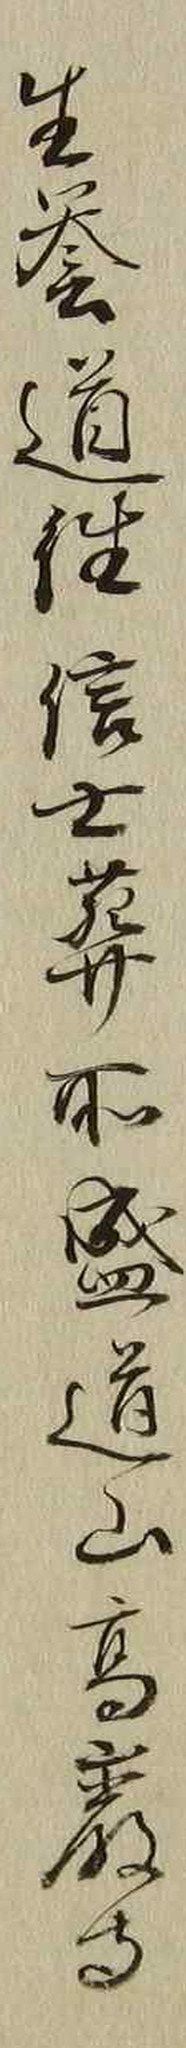生誉道往信士葬所盛道山高巌寺
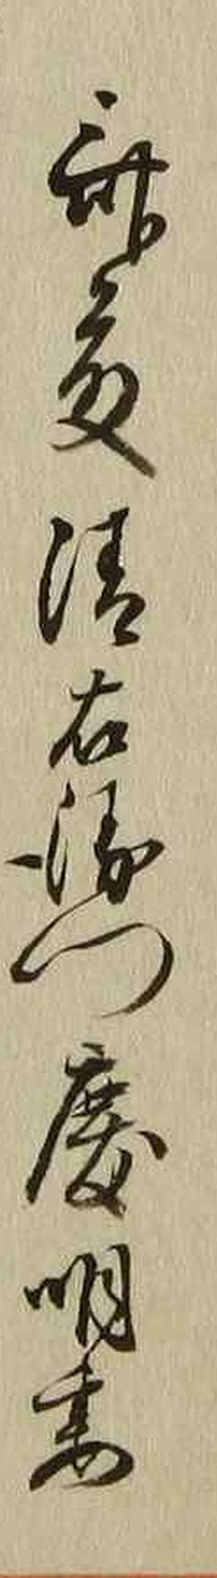女斎藤清右衛門慶明妻
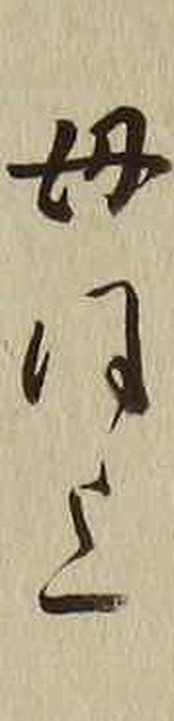母同上
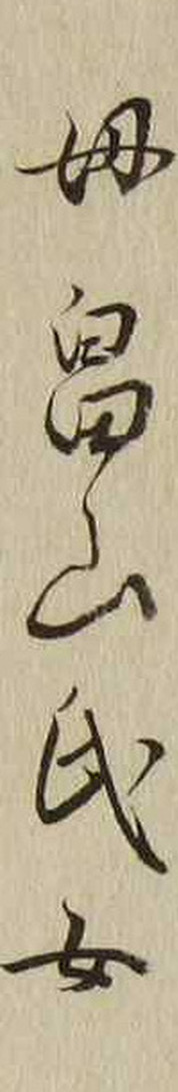母畠山氏女
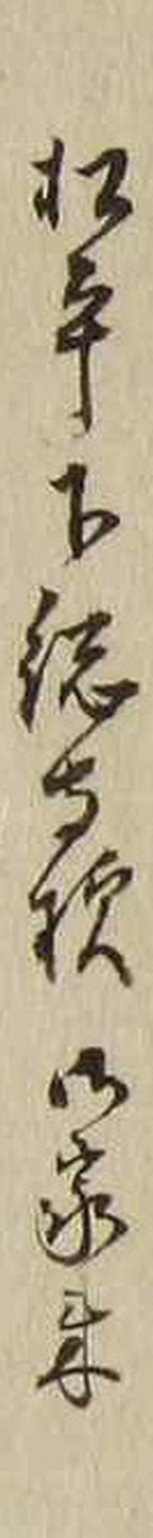松平下総守様御家来

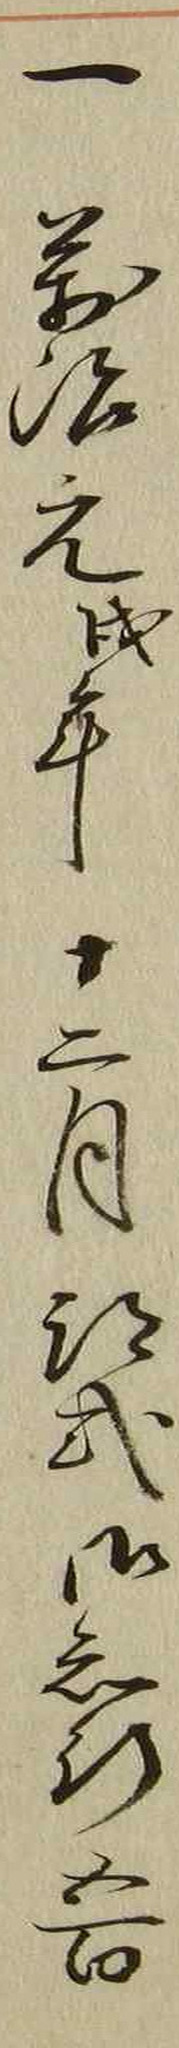一万治元戌年十二月跡式御知行五百
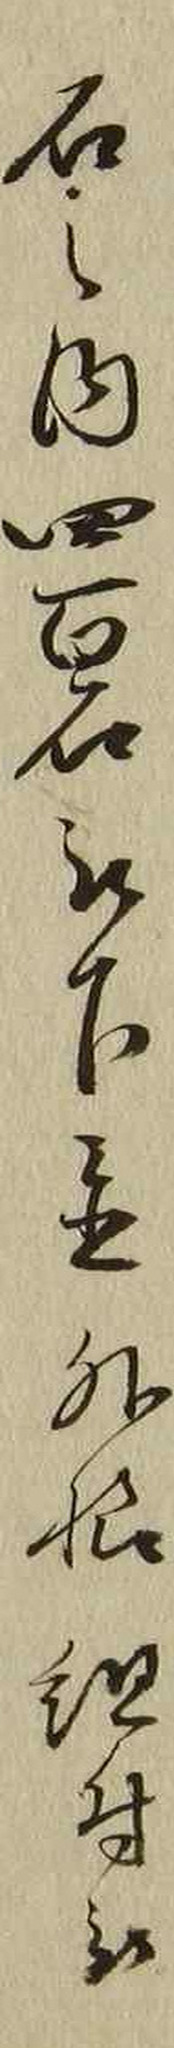石之内四百石被下置外様組付被
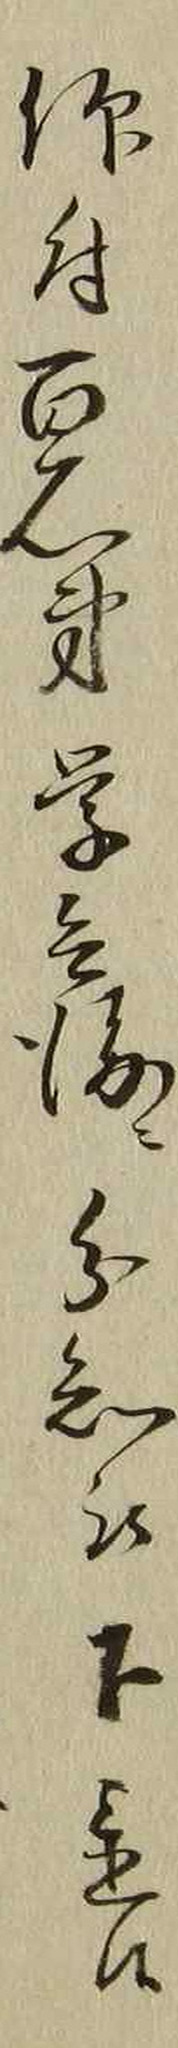仰付百石弟学兵衛ニ分知被下置候
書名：諸士系譜　巻之68　を之部2
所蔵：会津若松市立会津図書館
